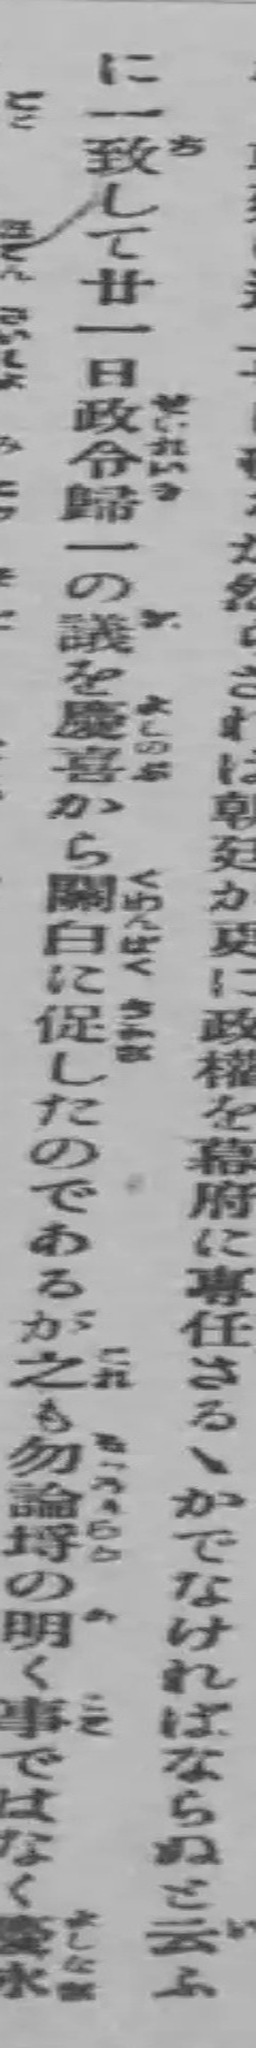に一致して廿一日政令帰一の議を慶喜から関白に促したのであるが之も勿論埒の明く事ではなく慶永
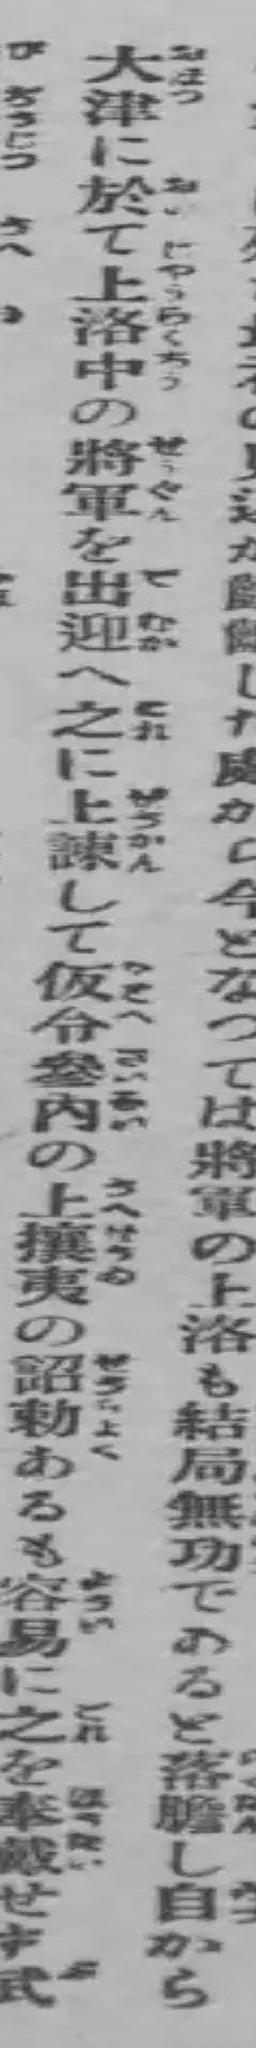大津に於て上洛中の将軍を出迎へ之に上諌して仮令参内の上攘夷の詔勅あるも容易に之を奉戴せず武
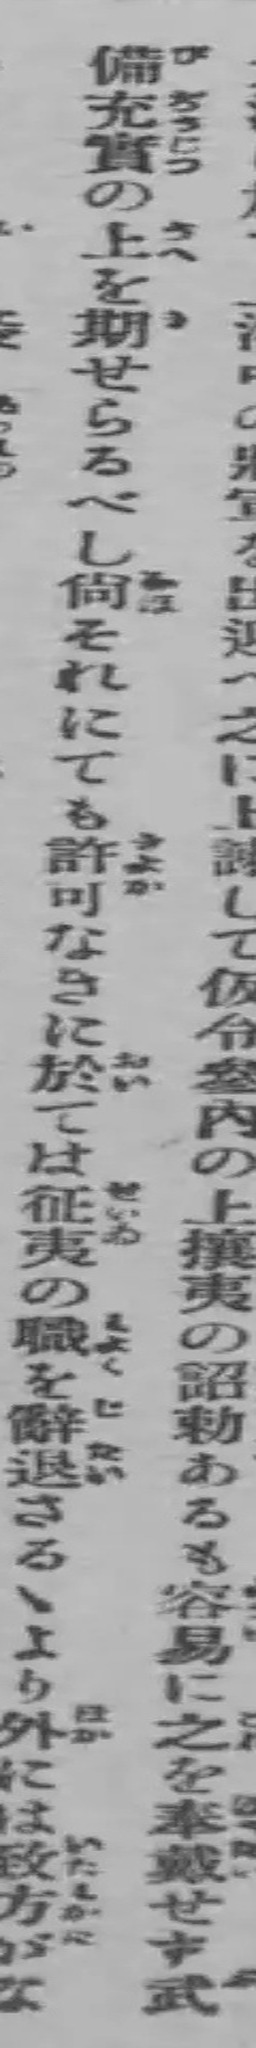備充実の上を期せらるべし尚それにても許可なきに於ては征夷の職を辞退さるゝより外には致方がな
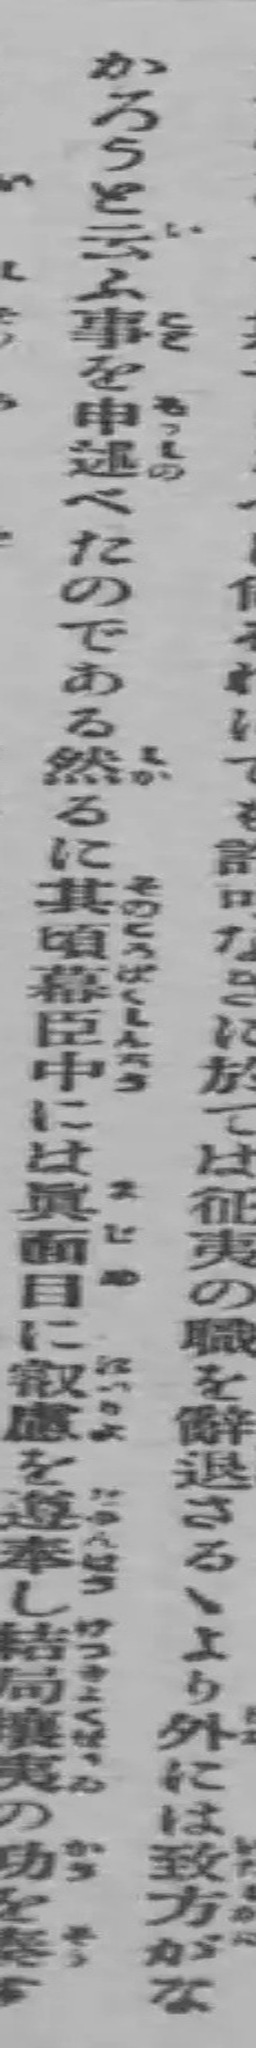かろうと云ふ事を申述べたのである然るに其頃幕臣中には真面目に叡慮を遵奉し結局攘夷の功を奏す
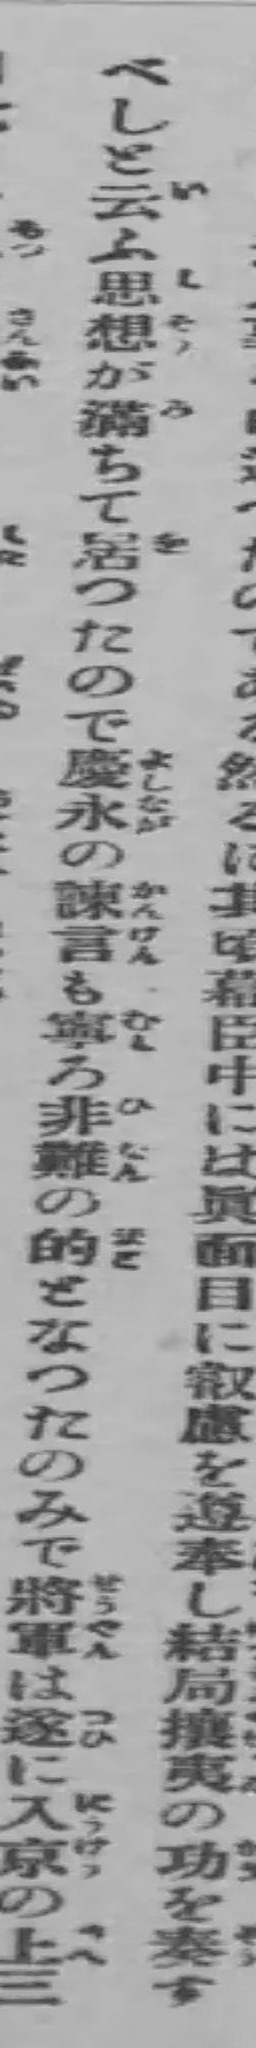べしと云ふ思想が満ちて居つたので慶永の諫言も寧ろ非難の的となつたのみで将軍は遂に入京の上三
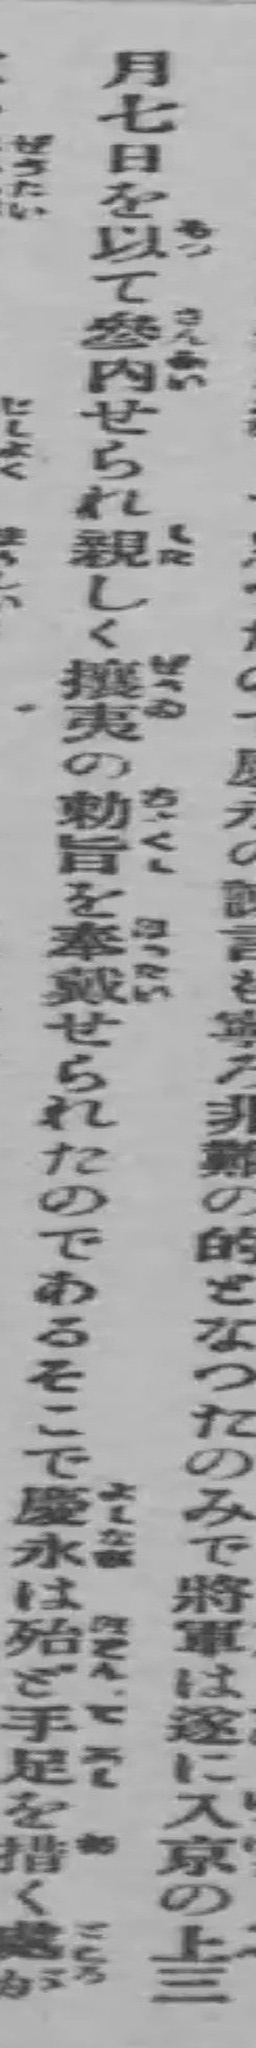月七日を以て参内せられ親しく攘夷の勅旨を奉戴せられたのであるそこで慶永は殆ど手足を満く処が
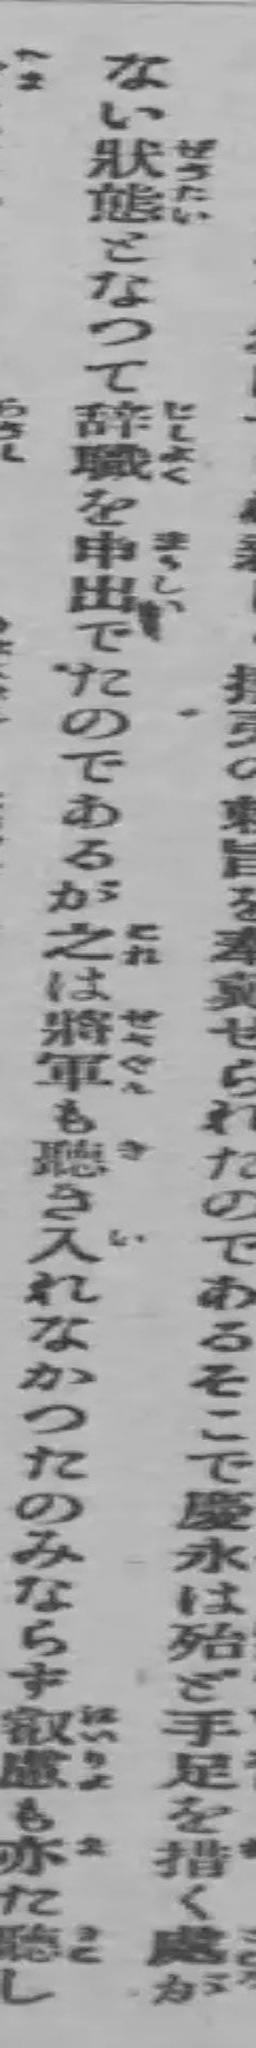ない状態となつて辞職を申出でたのであるが之は将軍も聞き入れなかつたのみならず叡慮も亦た聞し
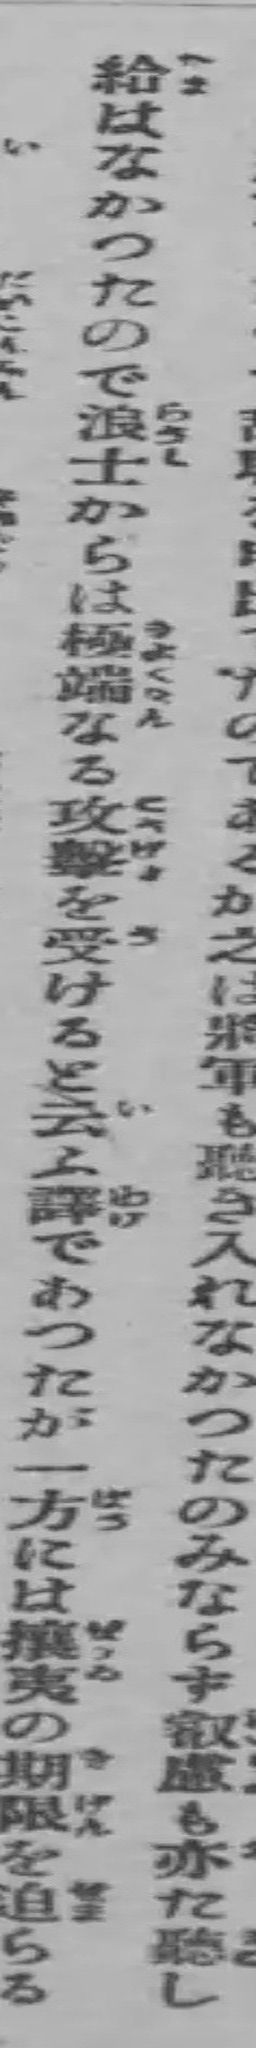給はなかつたので浪士からは極端なる攻撃を受けると云ふ訳であつたが一方には攘夷の期限を迫らる
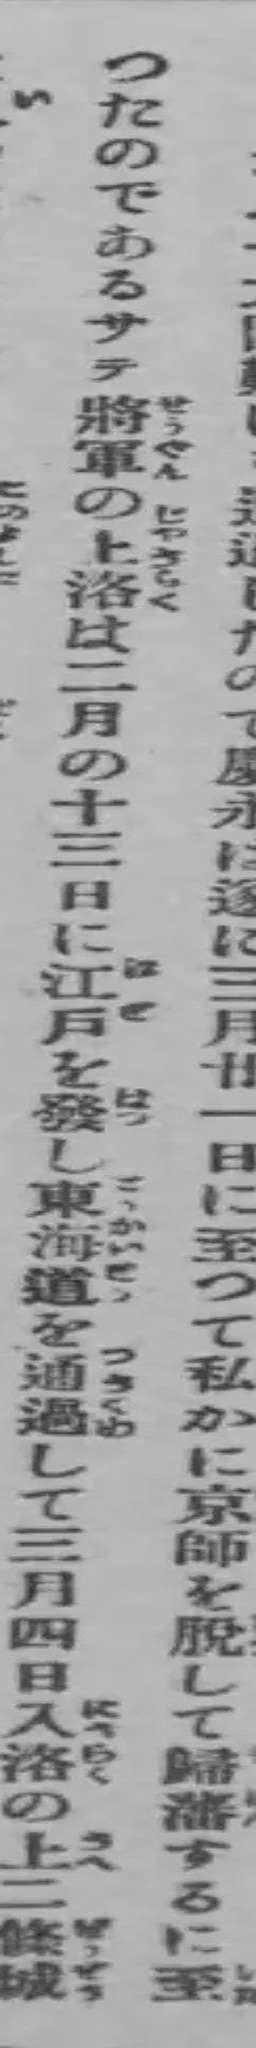つたのであるサテ将軍の上洛は二月の十三日に江戸を発し東海道を通過して三月四日入洛の上二条城
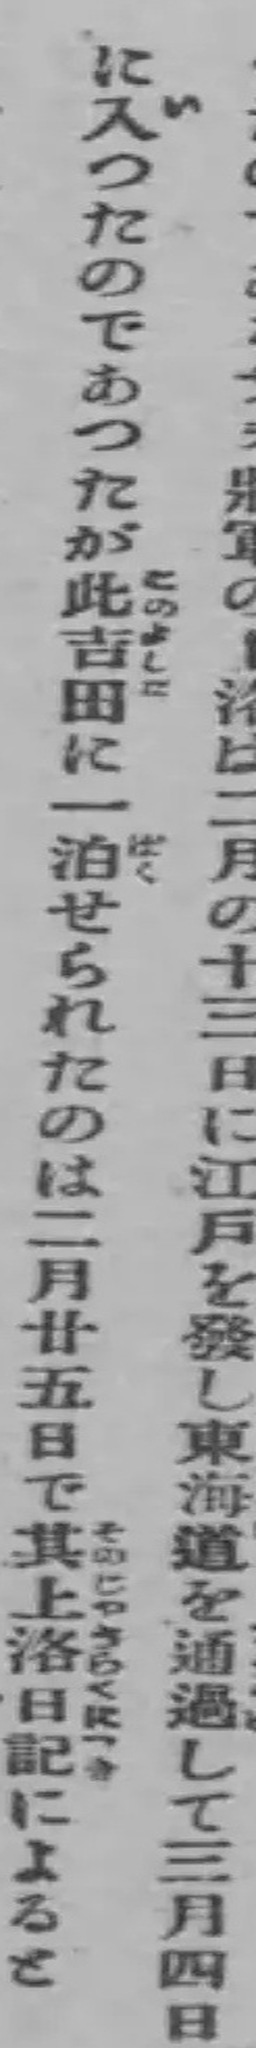に入つたのであつたが此吉田に一泊せられたのは二月廿五日で其上洛日記によると
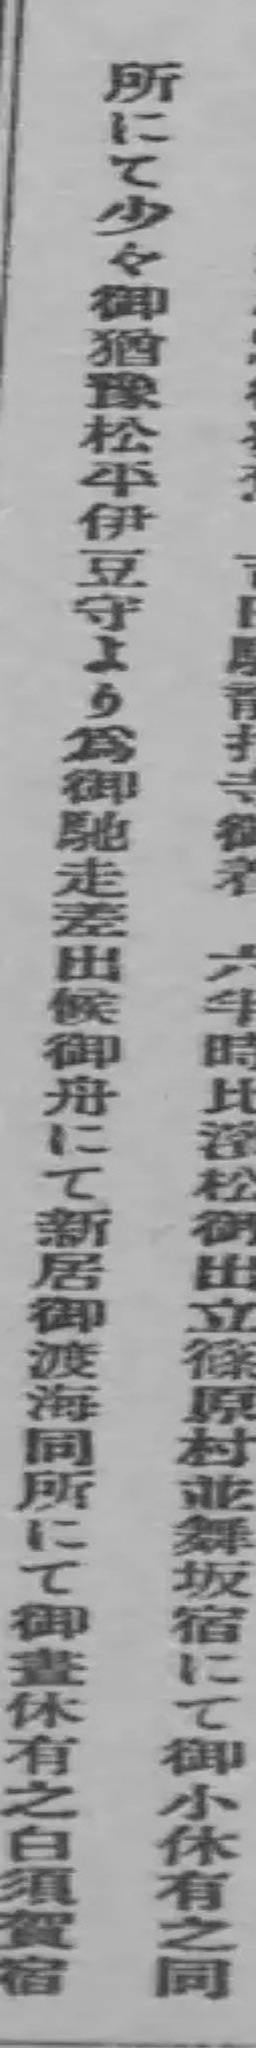所にて少々御猶予松平伊豆守より為御馳走差出候御舟にて新居御渡海同所にて御昼休有之白須賀宿
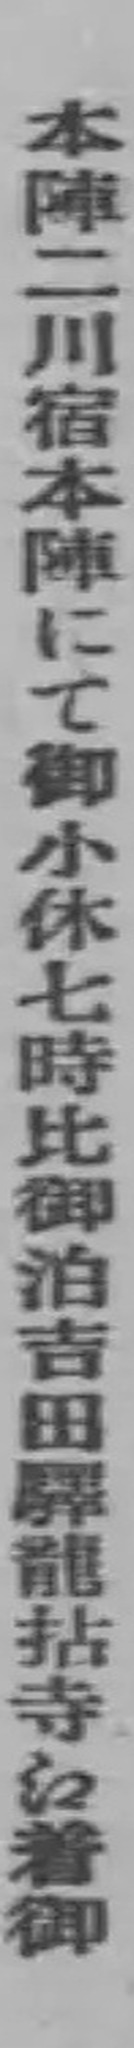本陣二川宿本陣にて御小休七時比御泊吉田駅龍拈寺え着御
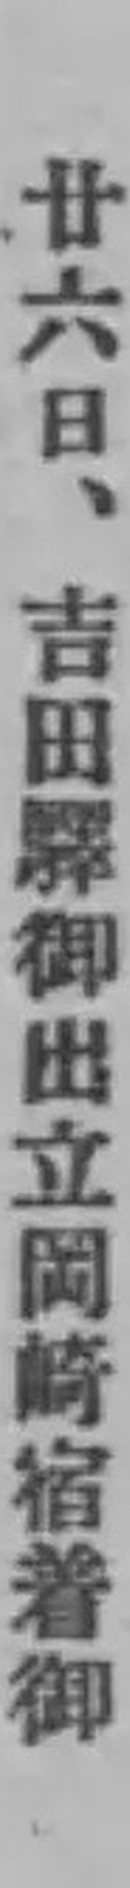廿六日、吉田駅御出立岡崎宿着御
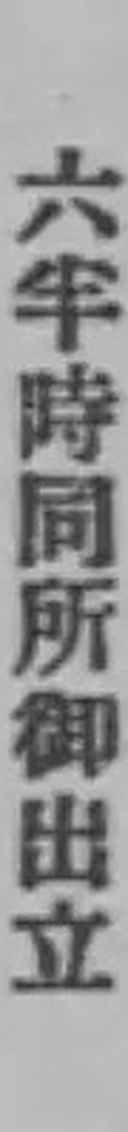六半時同所御出立
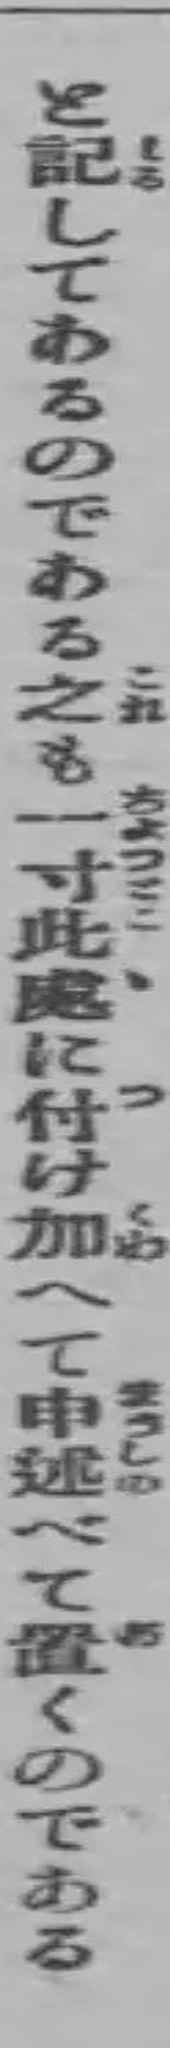と記してあるのである之も一寸此処に付け加へて申述べて置くのである
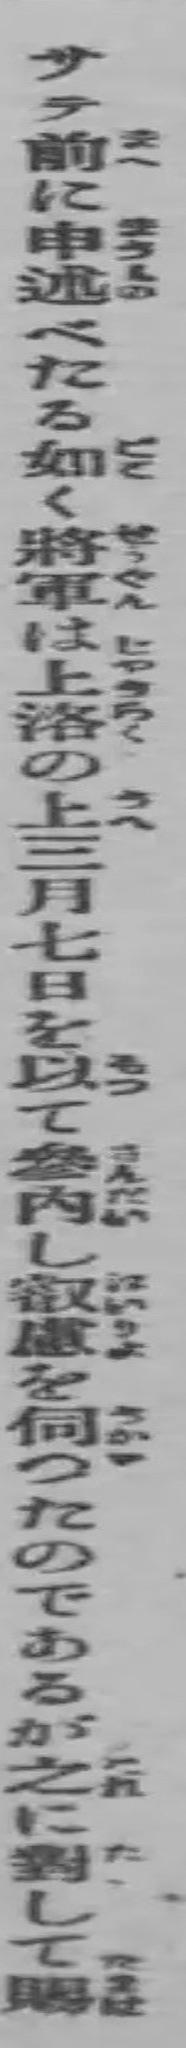サテ前に申述べたる如く将軍は上洛の上三月七日を以て参内し叡慮を伺つたのであるが之に対して賜
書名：豊橋市史談
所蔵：国立国会図書館 National Diet Library, JAPAN
